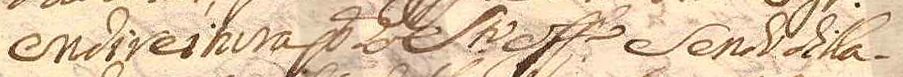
endireitura p̄ o S.to off.o sendo dilla
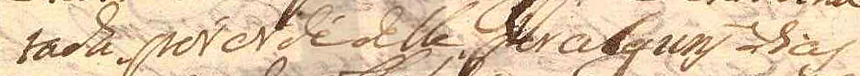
tada per ordē delle per alguns̄ dias
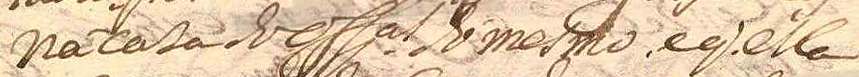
na caza do off.al do mesmo. e q̄ ella
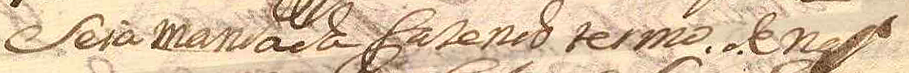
seia mandada fazendo termo. de naõ
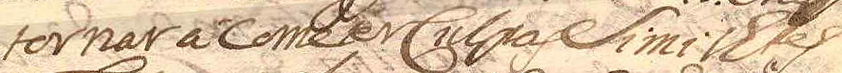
tornar a cometer Culpas Similhantes
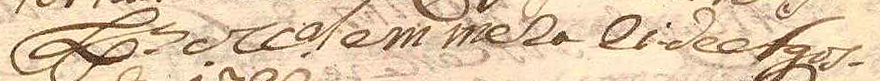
Lxa occ.al em meza 2i de Agos
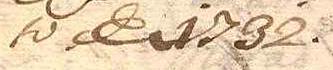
to de i732.
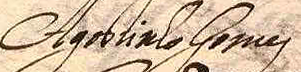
Agostinho Gomes
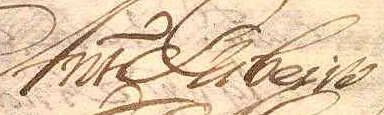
An̄to Ribeyro
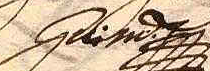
Guim.e
